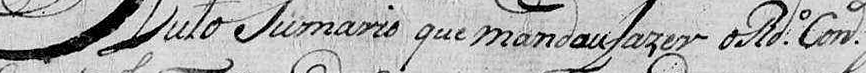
Auto Sumario que mandou fazer o Rd.o Con.o
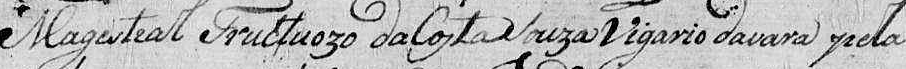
Magestral Fructuozo da Costa souza Vigario da vara pela
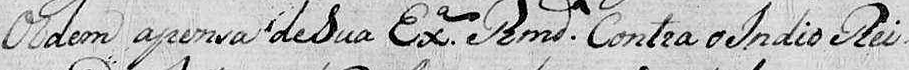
Ordem apensa de Sua Ex.a Rmd.a Contra o Indio Rei
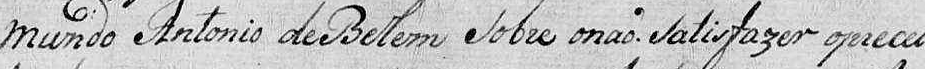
mundo Antonio de Belem sobre o naõ satisfazer o precei
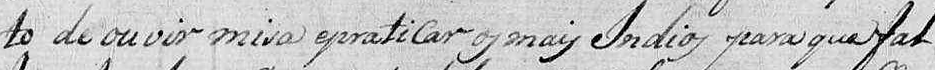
to de ouvir misa e pratiCar os mais Indios para que fal
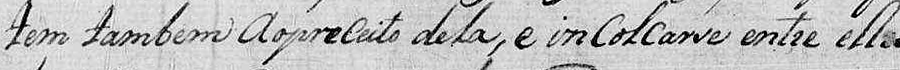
tem tambem ao preCeito dela, e inColcarse entre ell
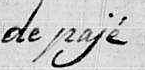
de pajé
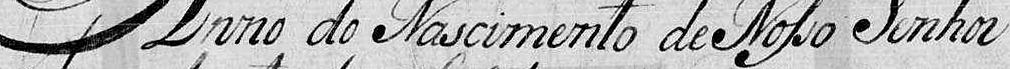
Anno do Nascimento de Nosso Senhor
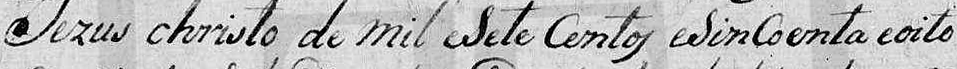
Iezus christo de mil e SeteCentos e SinCoenta e oito
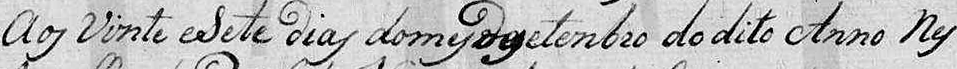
aos vinte e Sete dias do mes de setenbro do dito Anno Nes
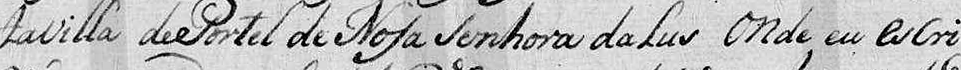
ta villa de Portel de Nosa senhora da Lus ONde eu esCri
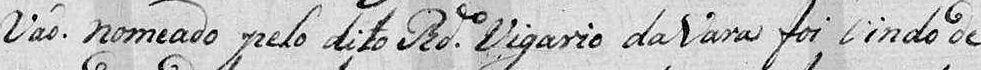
vaõ. nomeado pelo dito Rd.o Vigario da Vara foi vindo de
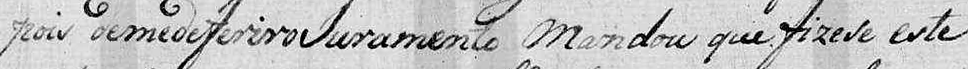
pois de me deferir o Iuramento Mandou que fizese este
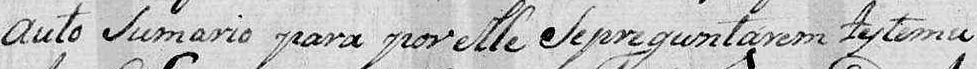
auto sumario para por elle se preguntarem testemu
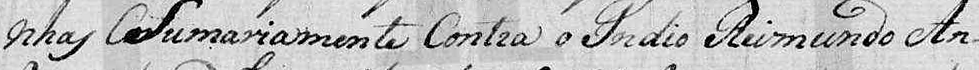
nhas Sumariamente Contra o Indio Reimundo An
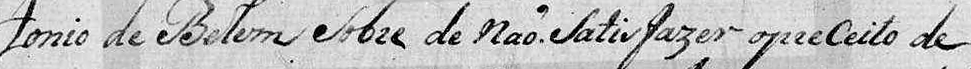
tonio de Belem sobre de naõ satisfazer o preCeito de
